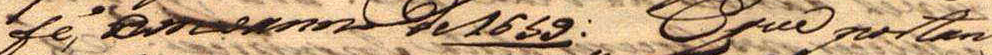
fé, em os anoz de 1659: E que portan
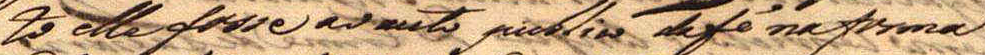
to elle fosse ao auto publico de fé na forma
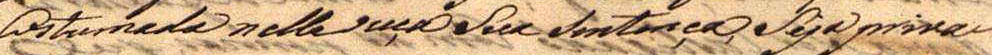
costumada nelle ouça Sua Sentença, e Seja priva
